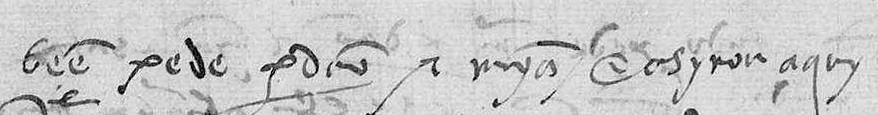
beē pēde ꝑdāo e myā e asynou aquy
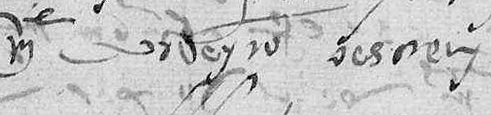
mel cordeyro o escreuj
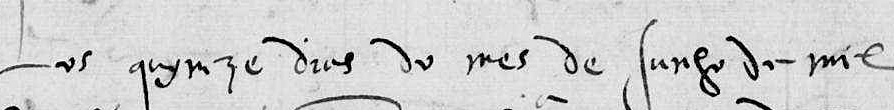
Aos quymze dias do mes de Junho de mil
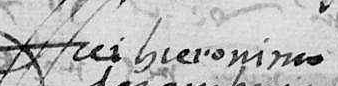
frei hieronimo
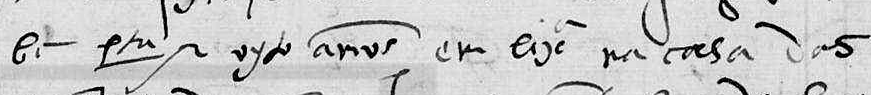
bc Lta e oyto an̄os em lixa na casa das
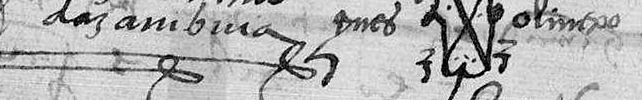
dazambuia yues oliuro
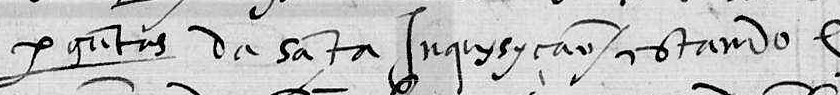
ꝑ gu̅tas da sāta Jnquysyção / estando hy
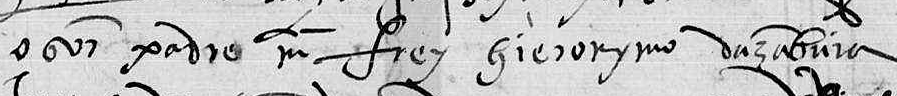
o sōr padre mte frey hieronymo dazābuia
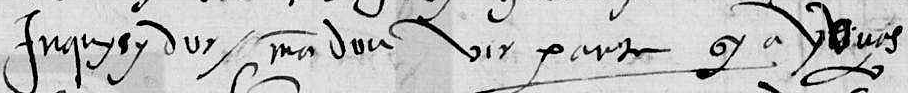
Jnquysydor / m̅adou vir ꝑante sy a yuas
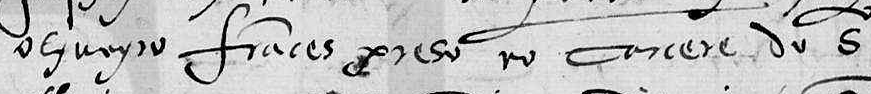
olyueyro frāces preso no carcere do Sto
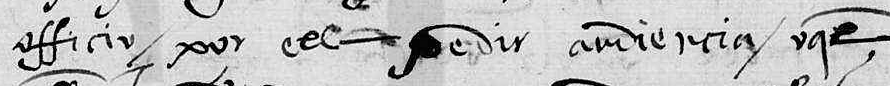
officio / por elle pedir audiencia / o q̄l
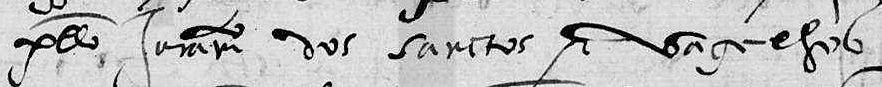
p̄llo Juramto dos sanctos eva̅gelhos
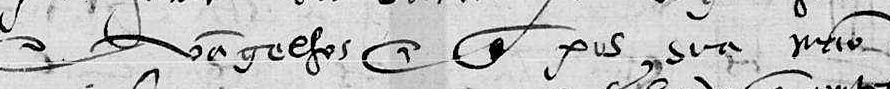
evāgelhos e̅ q̅ pos sua mão
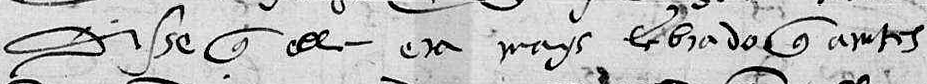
disse q̅ elle era mays lēbrado q̄ amtes
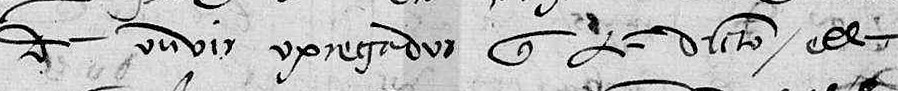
de ouvir o pregador q̄ tē dicto / elle
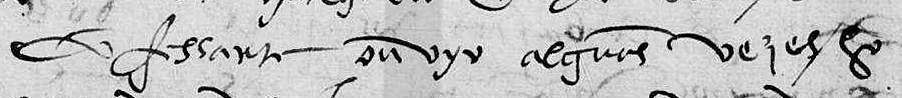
co̅fessante ouvyo algu̅as vezes / ho
